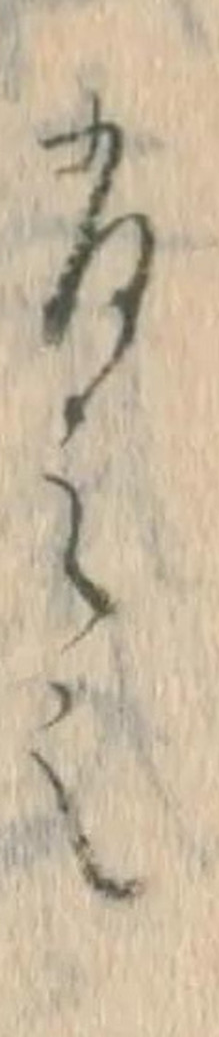有之也
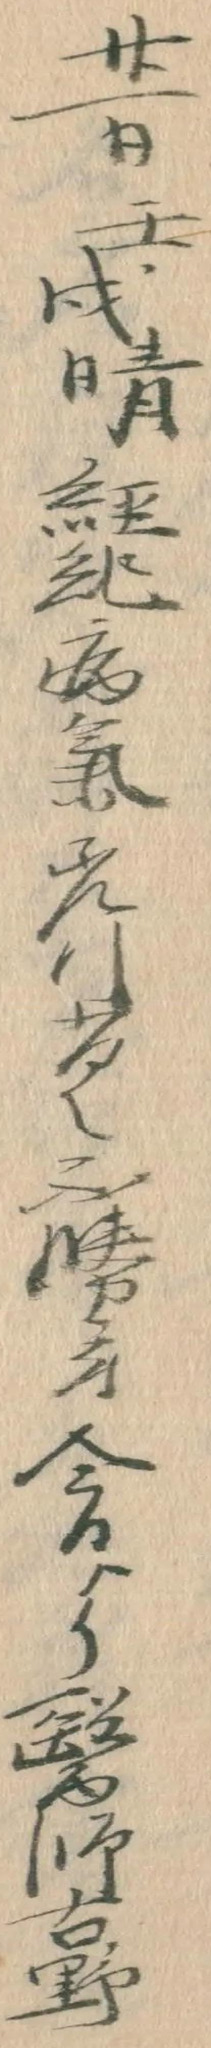廿一日壬戌晴経記病気差引有之不勝ニ付今日より醫師古野
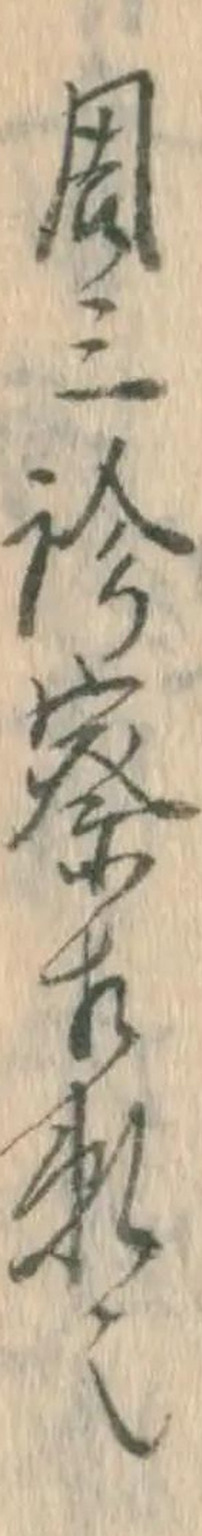周三診察相頼也

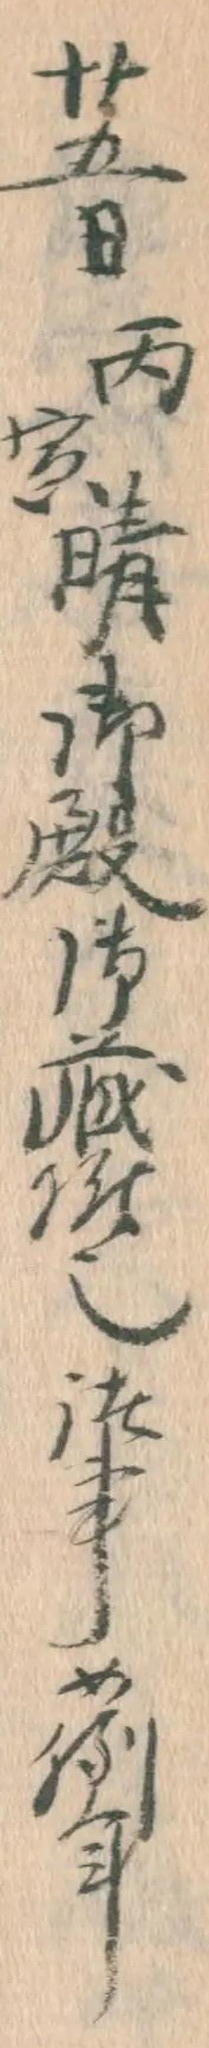廿五日丙寅晴御殿御蔵附也諸事如例年
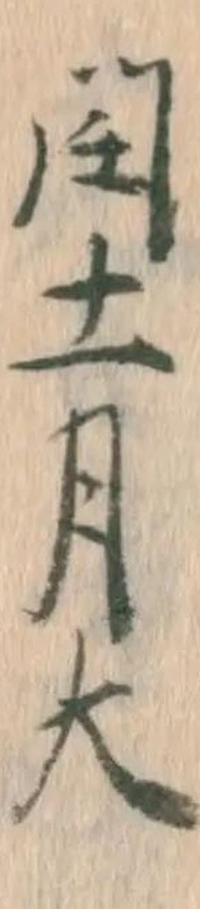閏十一月大
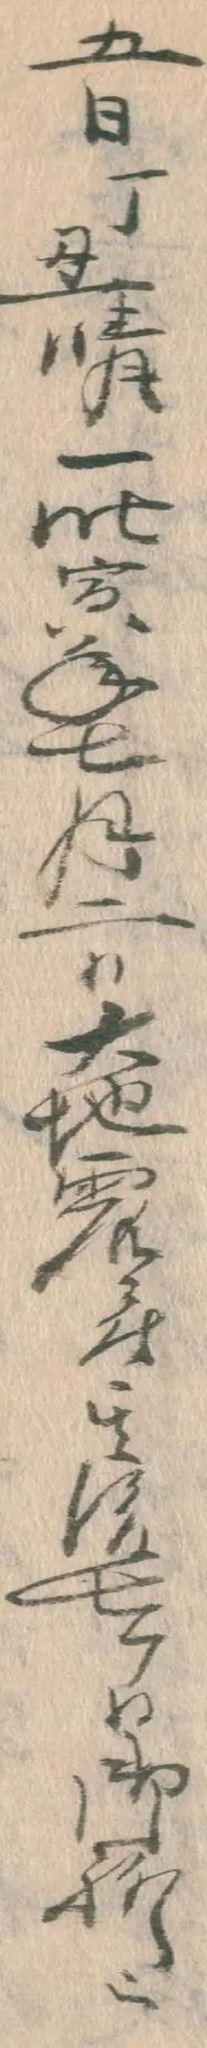五日丁丑晴一昨寅年七月二日大地震ニ付其後七ケ日御祈被
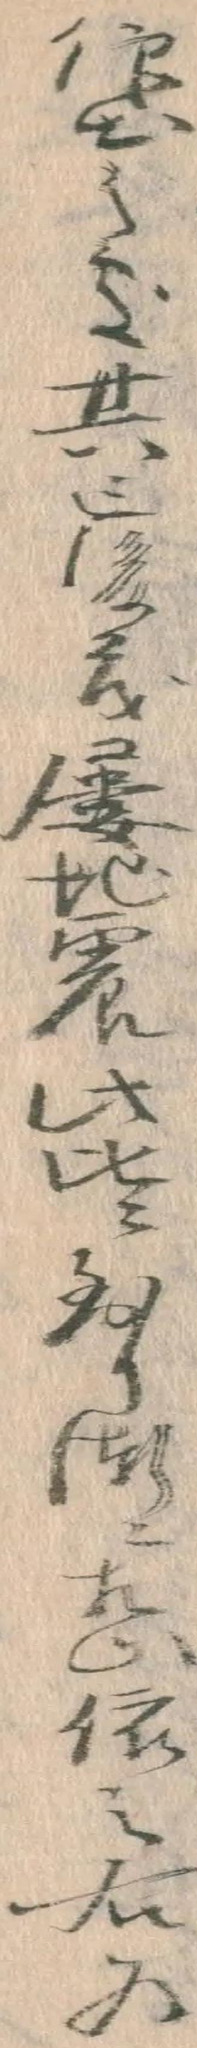仰出之處其已後も屢地震此比ニ至り漸ニ相止依之右為
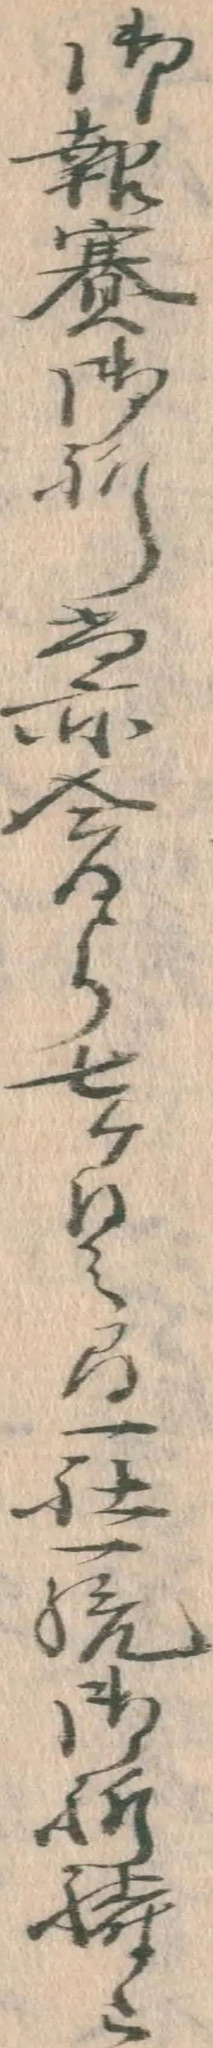御報賽御祈尚亦今日より七ヶ日之間一社一統御祈祷被
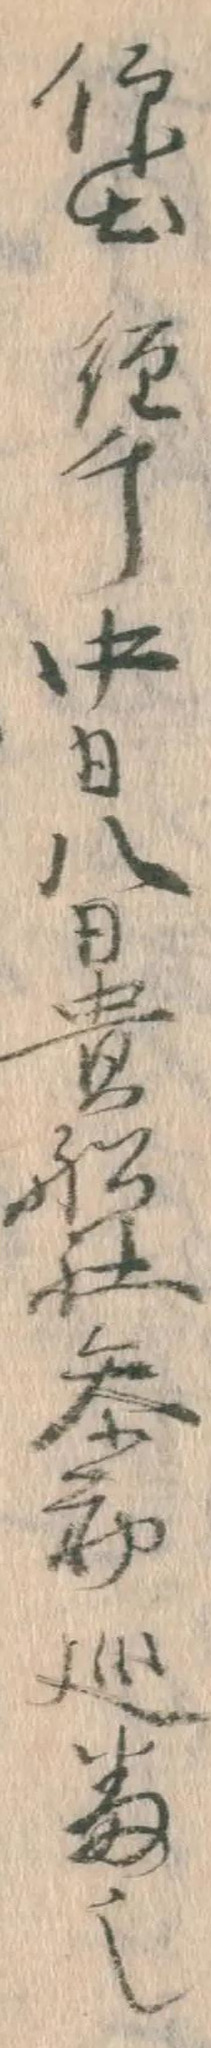仰出経千中日八日貴船仕参勤巡番也
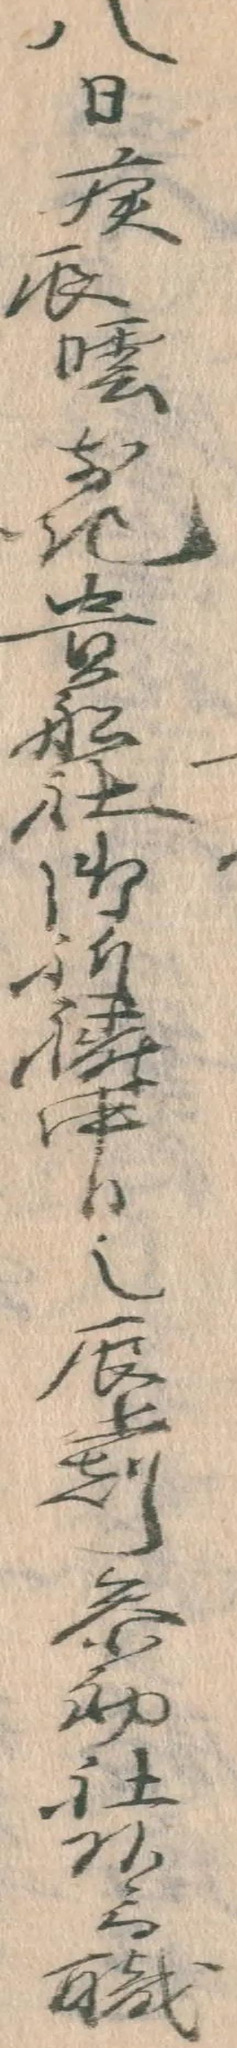八日庚辰曇前記貴舩社御祈祷中日也辰上刻参勤社頭ニ而職
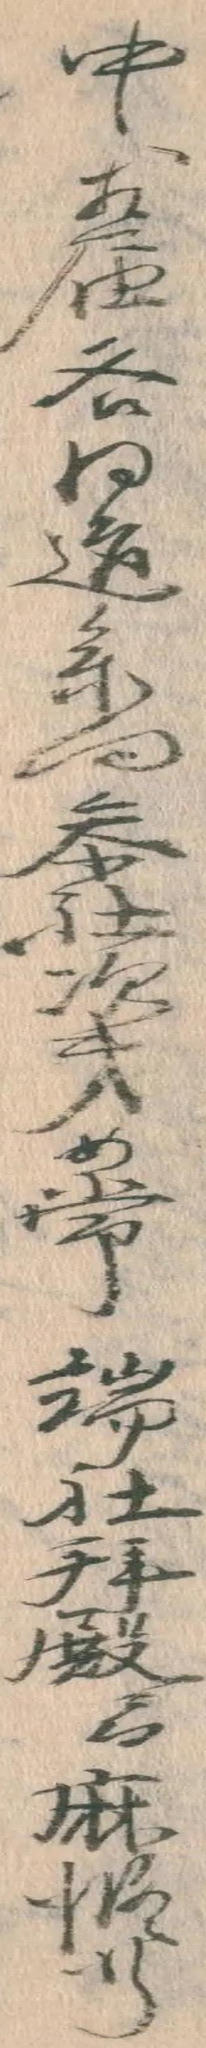中へ相届各同道参向参社次第如常端社拝殿ニ而麻修行
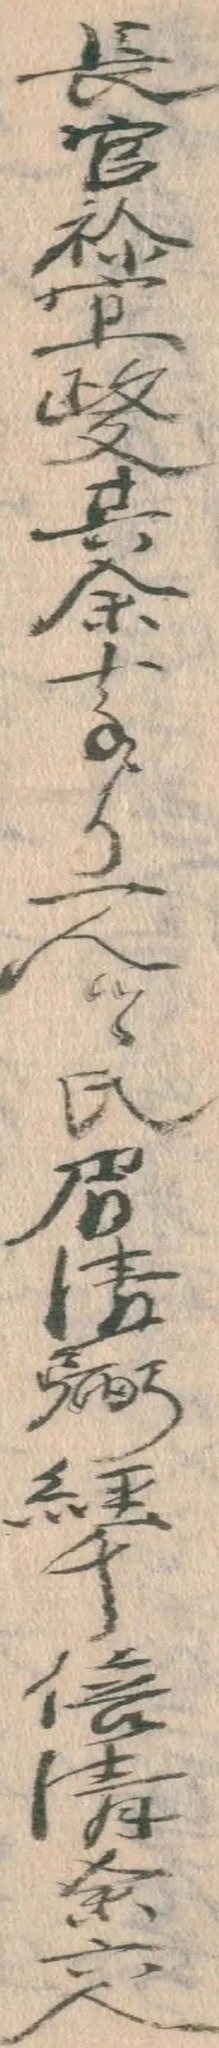長官祢宜政久其余十手より一人ツヽ氏眉清弼経千倍清余六人
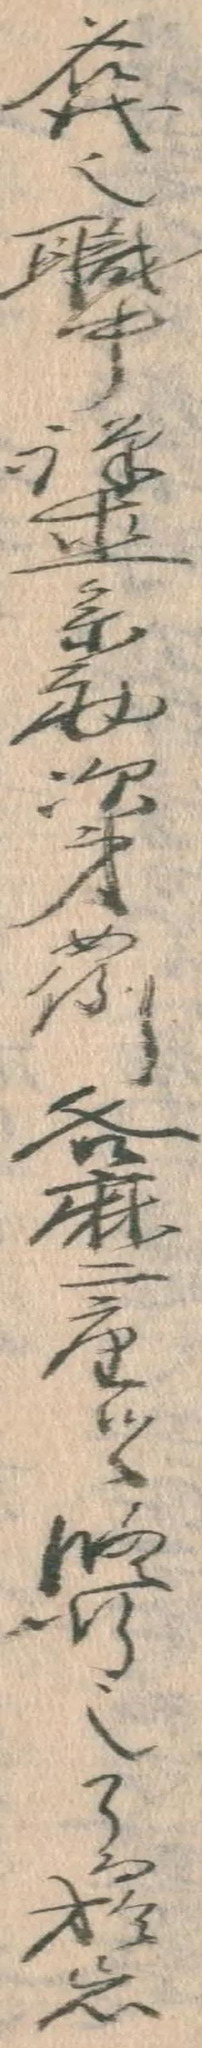名代也職中謹直参勤次第如例各麻二座ツヽ修行也了而於忌
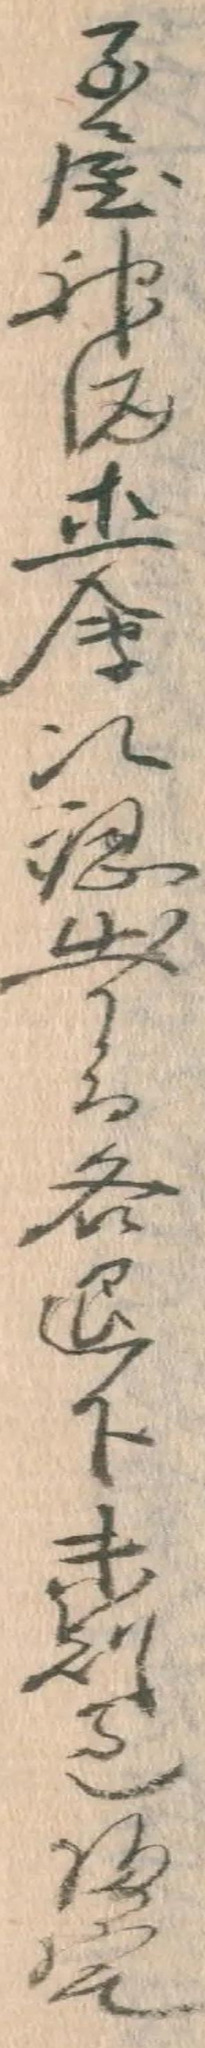子屋神酒直會頃認出了而各退下未刻過帰宅
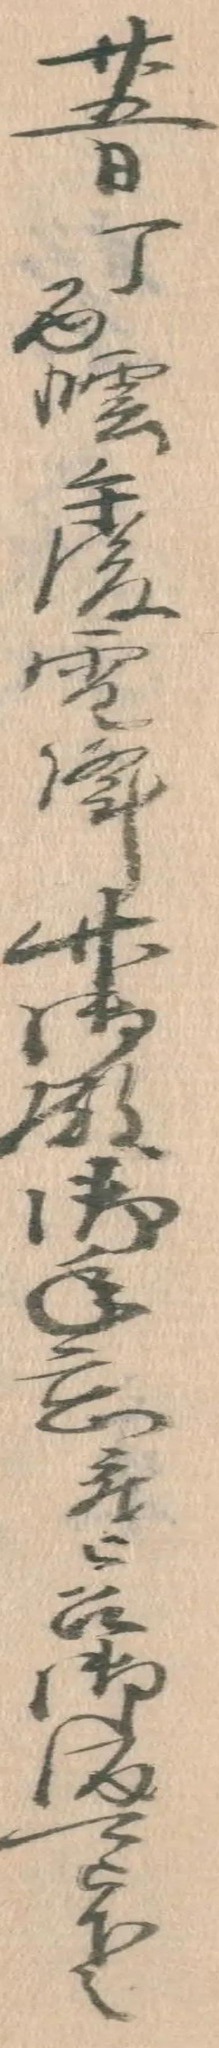廿五日丁酉曇午後雪降竹御殿御年忘ニ付被召御酒可被下之
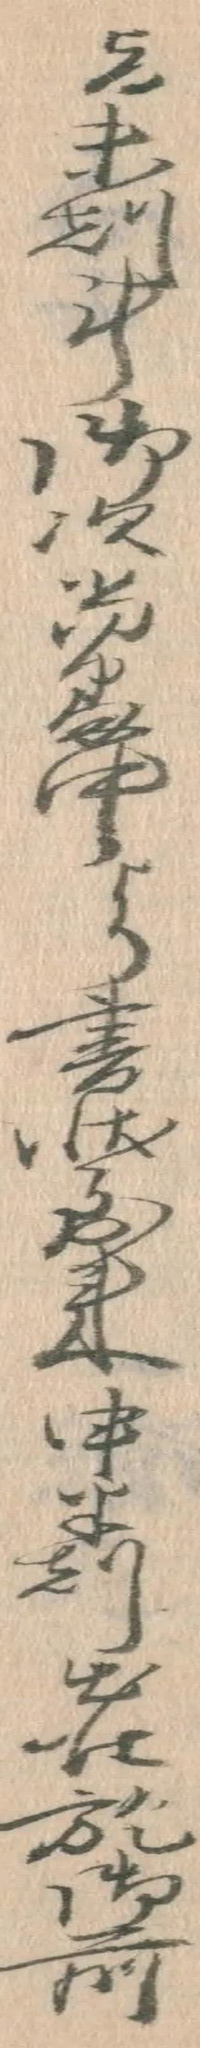旨未刻斗御次當番中より書状到来申半刻出仕於御前
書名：賀茂社記録. 第66冊
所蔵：国立国会図書館 National Diet Library, JAPAN
